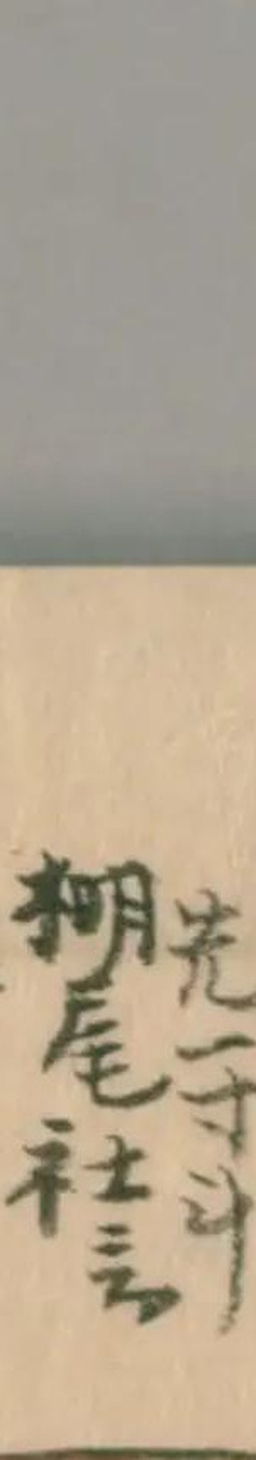棚尾社ニ而
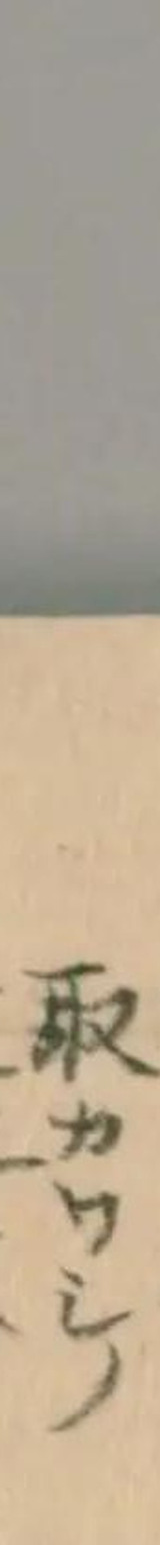取カワシノ
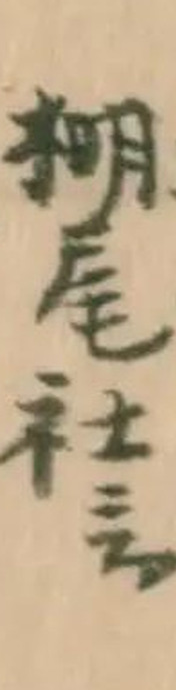棚尾社ニ而
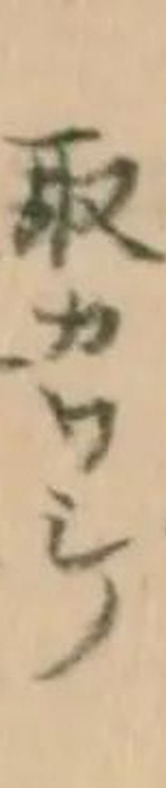取カワシノ
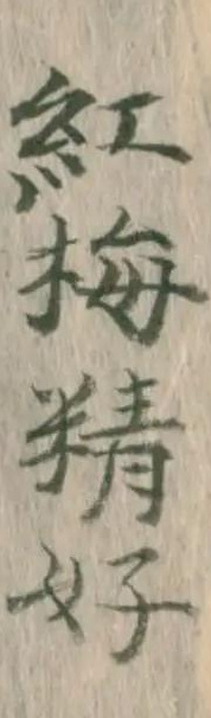紅梅精好
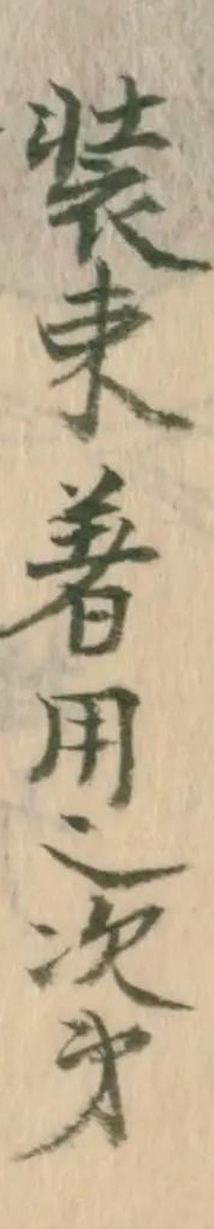装束着用之次第
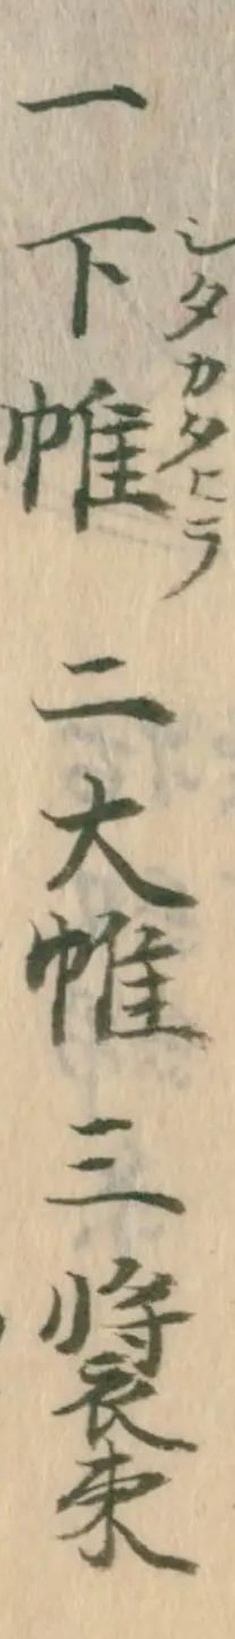一下帷二大帷三装束
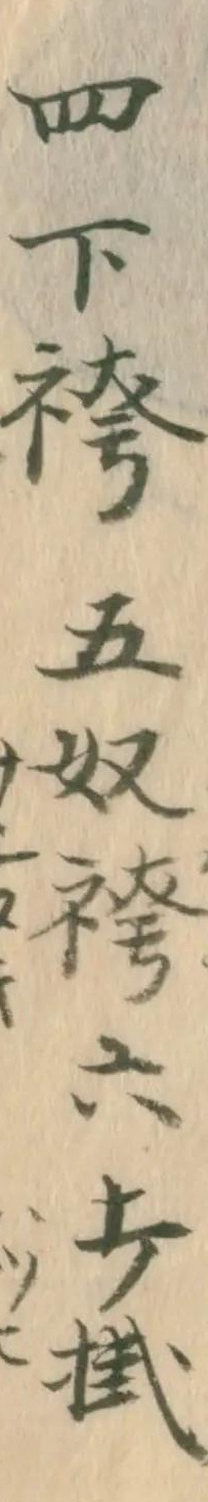四下袴五奴袴六打掛
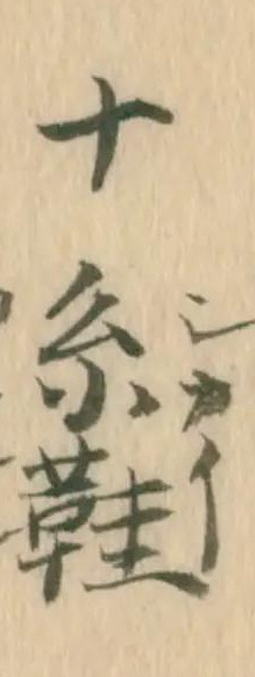十糸鞋

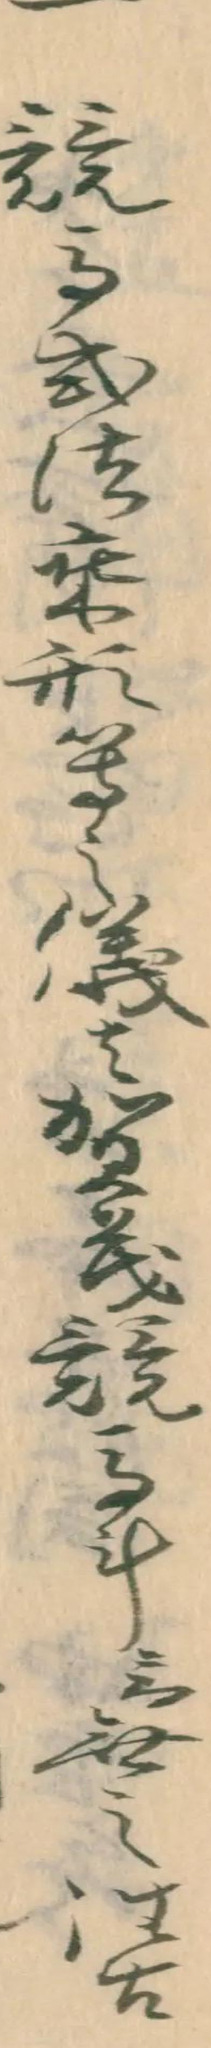一競馬式法乗形等之儀は賀茂競馬計ニ而無之往古
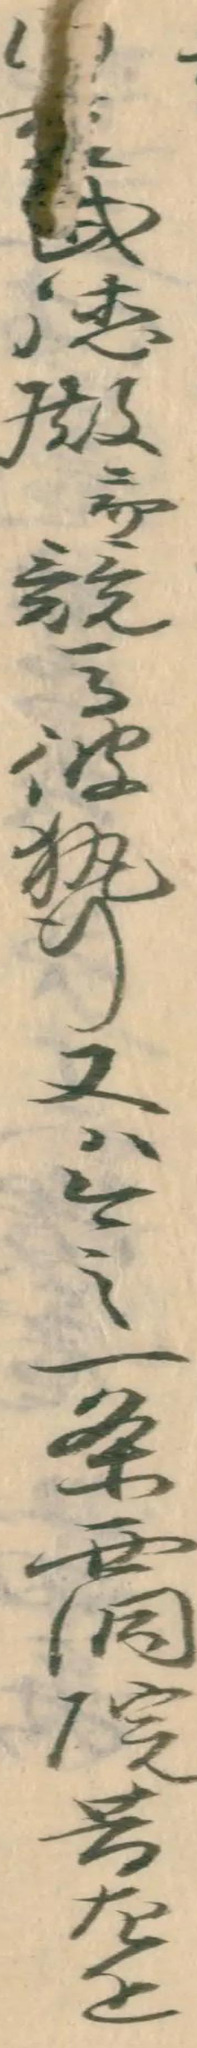同内裏武徳殿ニ而競馬被執行又ハ今之一条西洞院昔左近
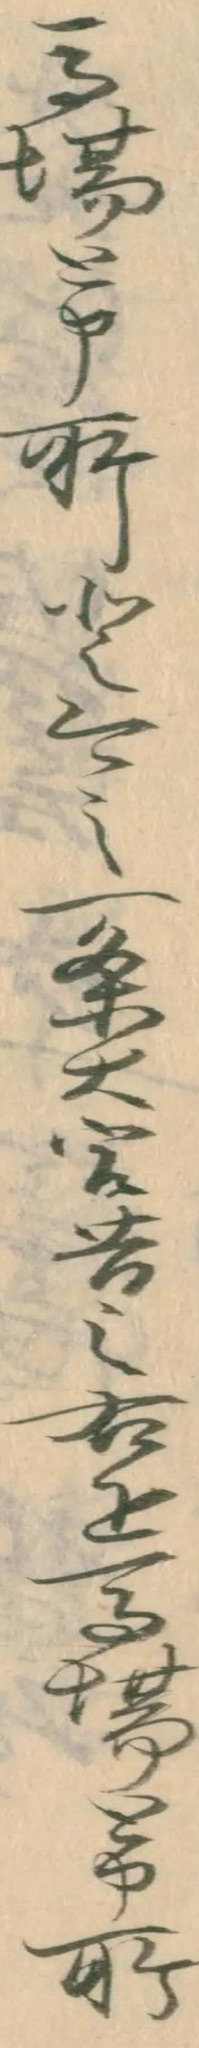馬場と申所と今の一条大宮昔之右近馬場と申所
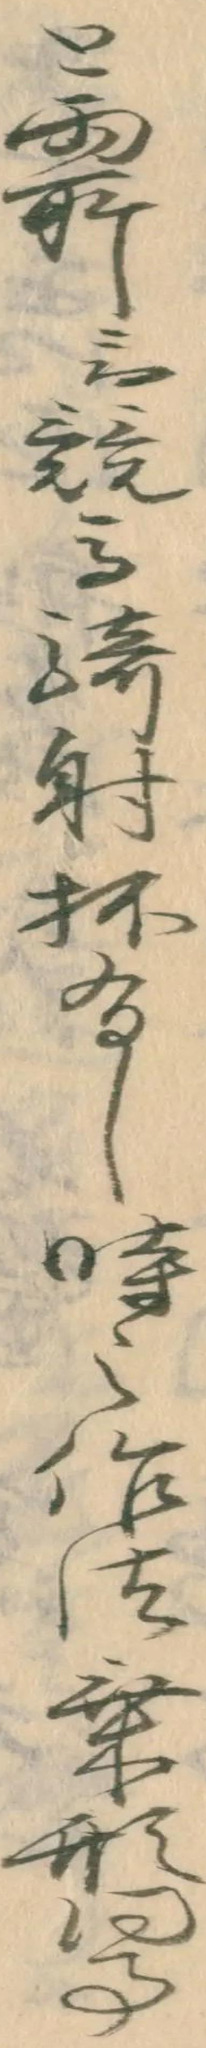と両所ニ而競馬騎射抔有し時之作法乗形同事
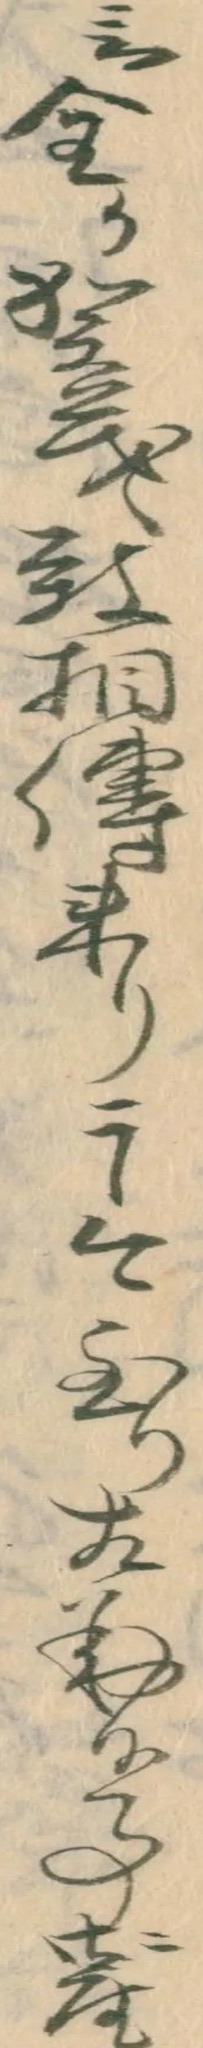ニ而全ク賀茂へ致相伝来り候于今至り相勤候事ニ御座
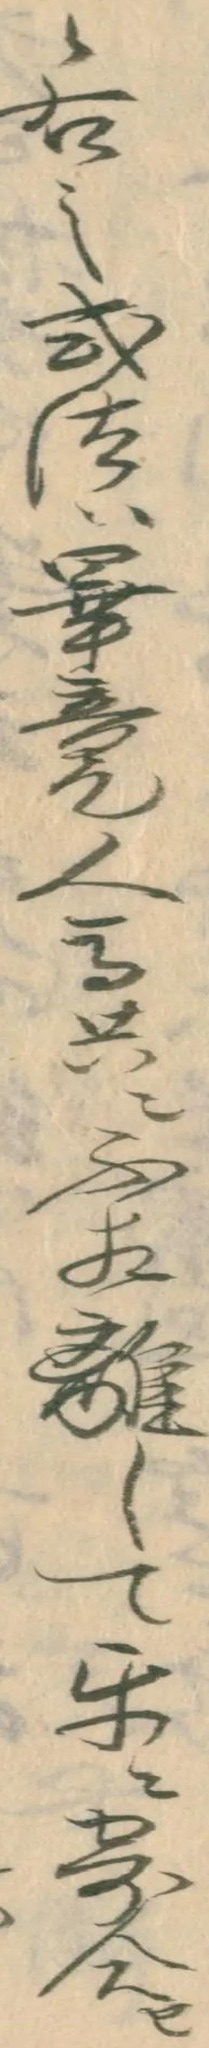候右之式法ハ畢竟人馬共ニ不相離して互ニ寄合セ
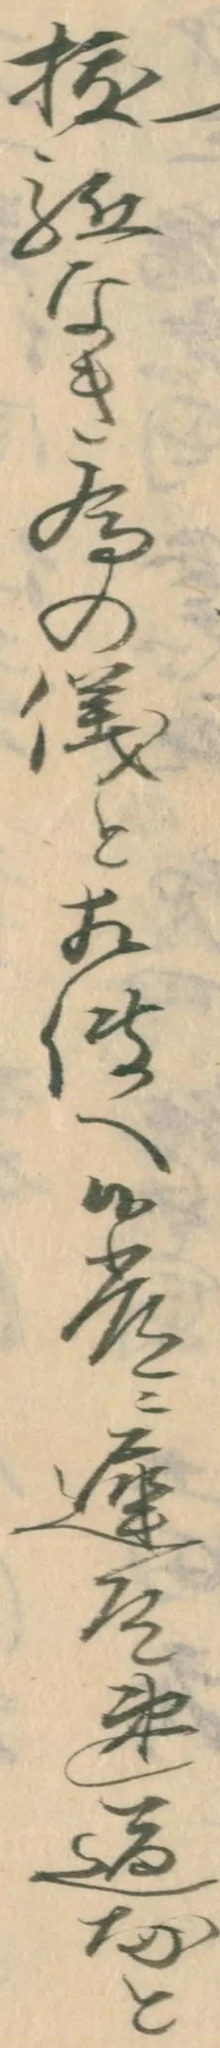抜駈なき為の儀と相伝へ候常ニ遅道速道なと
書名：賀茂社記録. 第12冊
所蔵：国立国会図書館 National Diet Library, JAPAN
